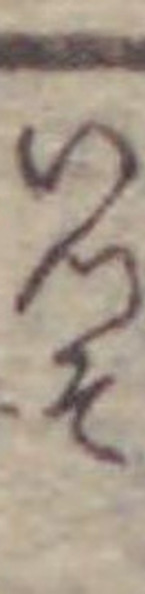いつそ
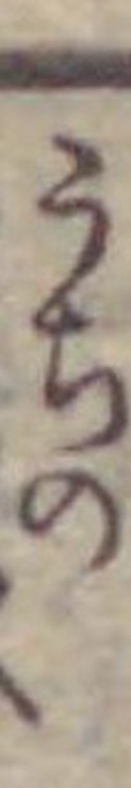うちの
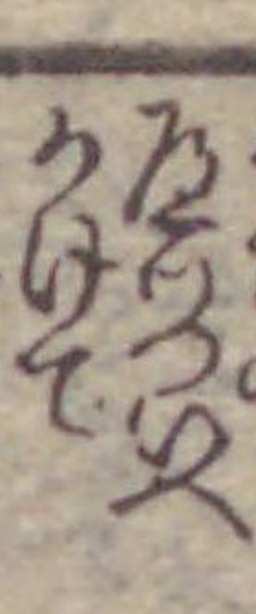かけて
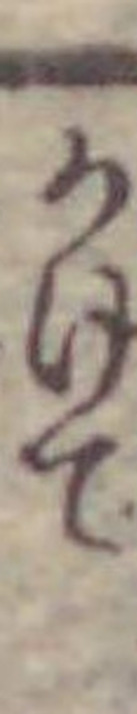かけて
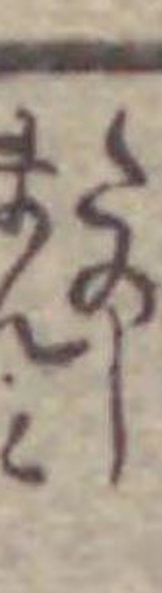まんと
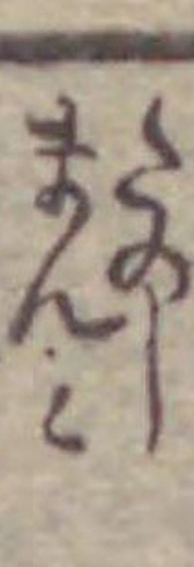まんと
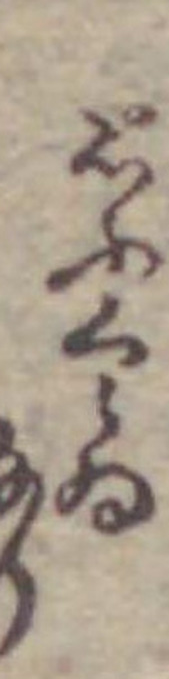思ふくらゐ

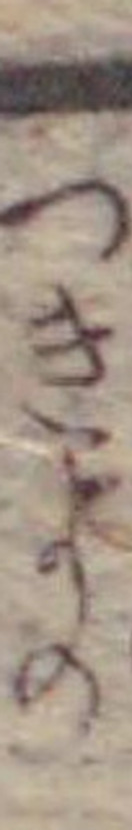つきよの
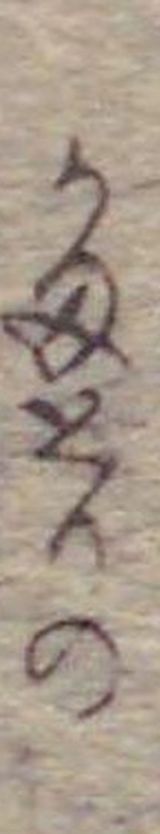かまとんの
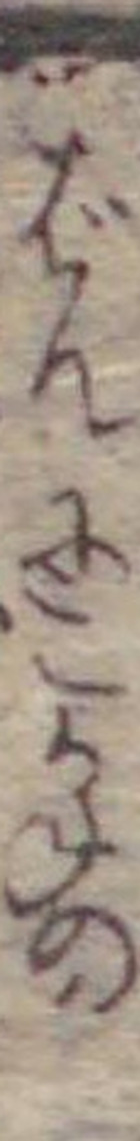ばんにこかねの
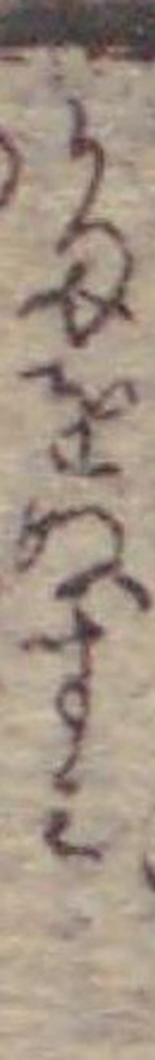かまをぬすみ
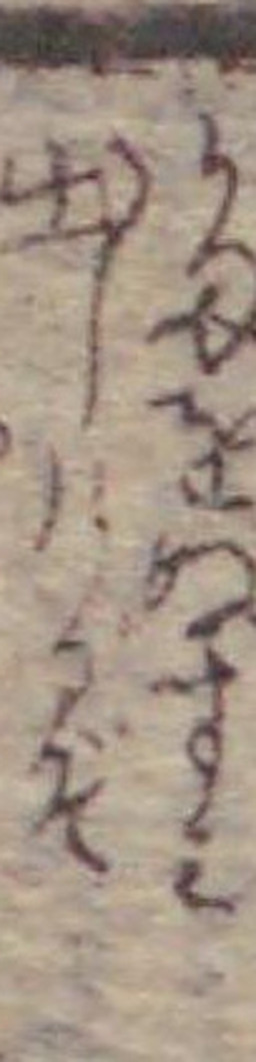出しけるぞ
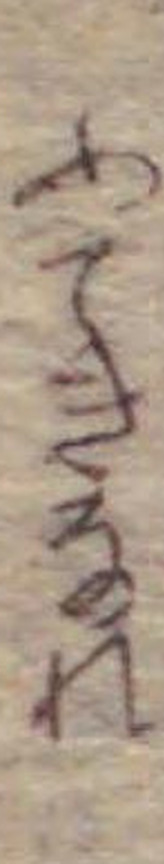ふてきなれ

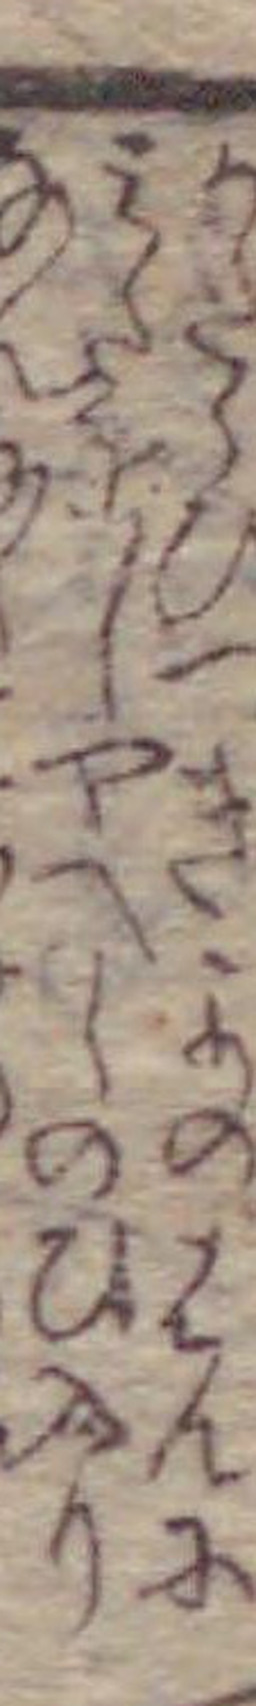みたをしやへしのひ入り
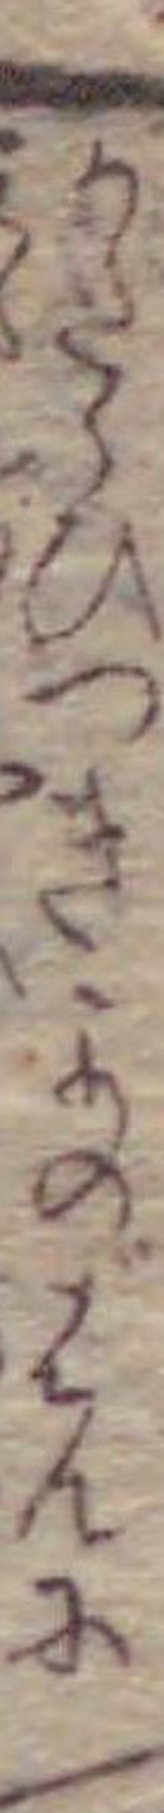かたらひつきよのばんに
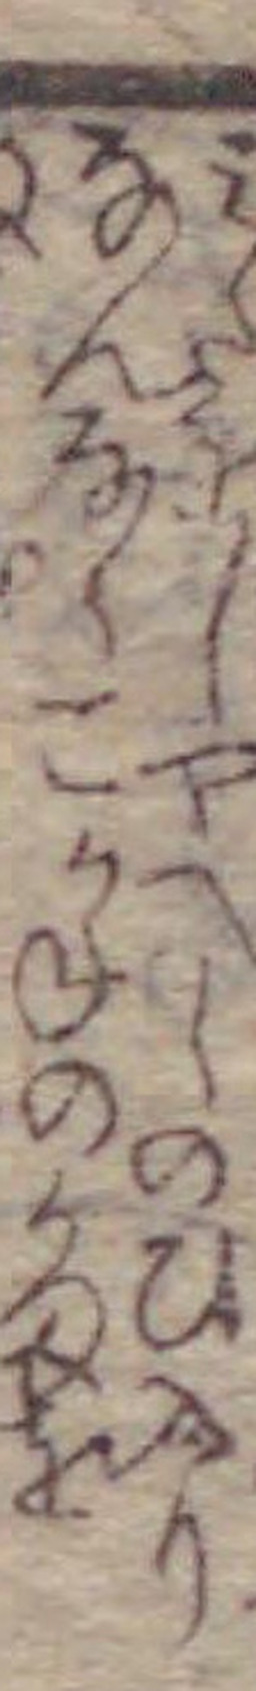なんなくこかねのかまを
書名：万物小遣帳 : 2巻
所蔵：国立国会図書館 National Diet Library, JAPAN
